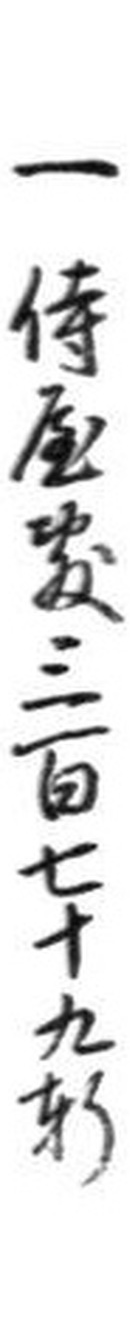一侍屋敷三百七十九軒
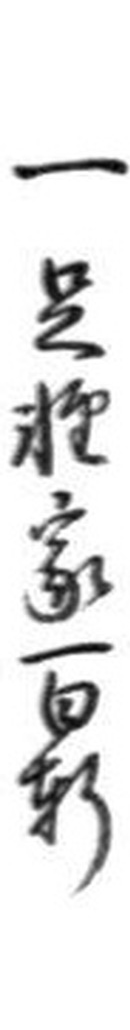一足軽家百軒
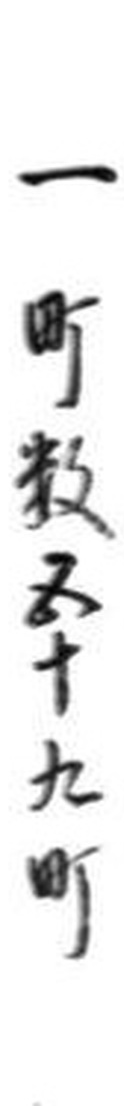一町数五十九町
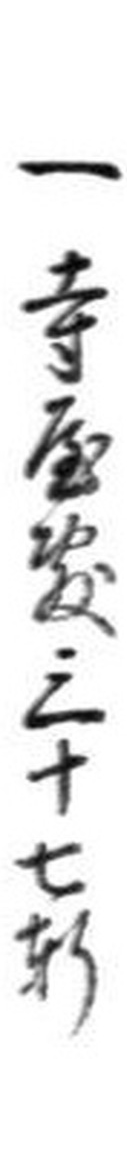一寺屋敷三十七軒
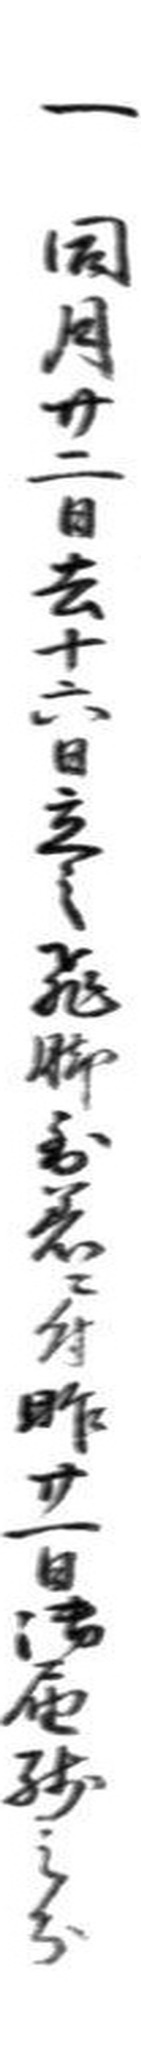一同月廿二日去十六日立之飛脚到着ニ付昨廿一日御届残之分
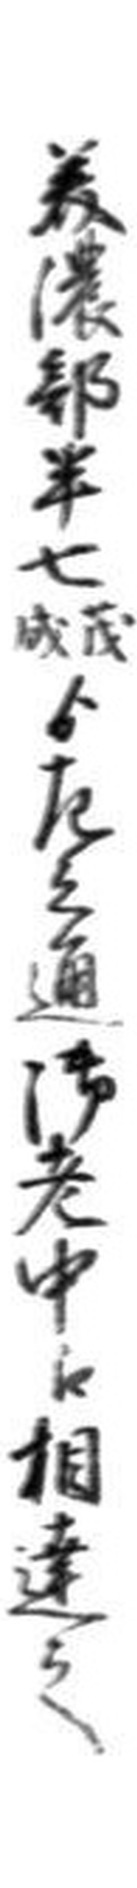美濃部半七茂成ゟ左之通御老中江相達之
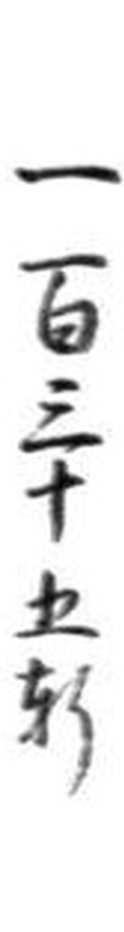一百三十五軒
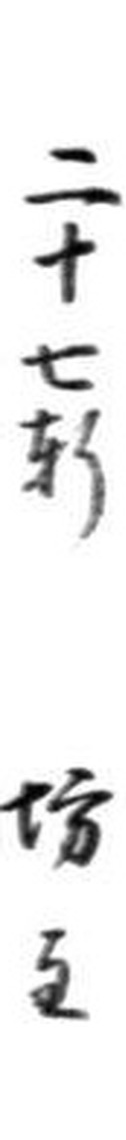二十七軒坊主
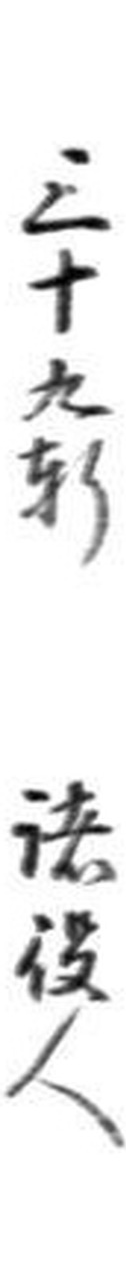三十九軒諸役人
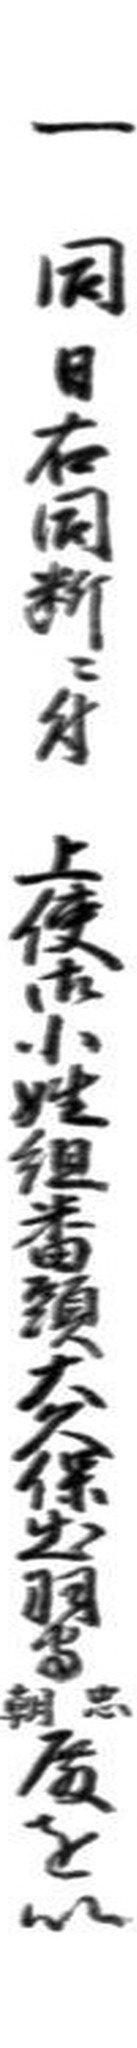一同日右同断ニ付上使御小姓組番頭大久保出羽守忠朝殿を以

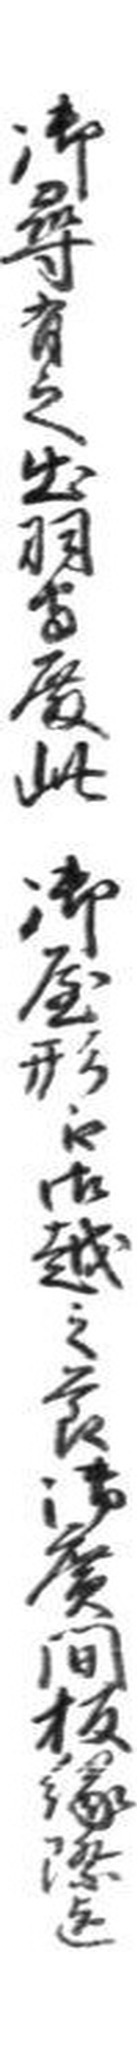御尋有之出羽守殿此御屋形江御越之節御広間板縁際迄
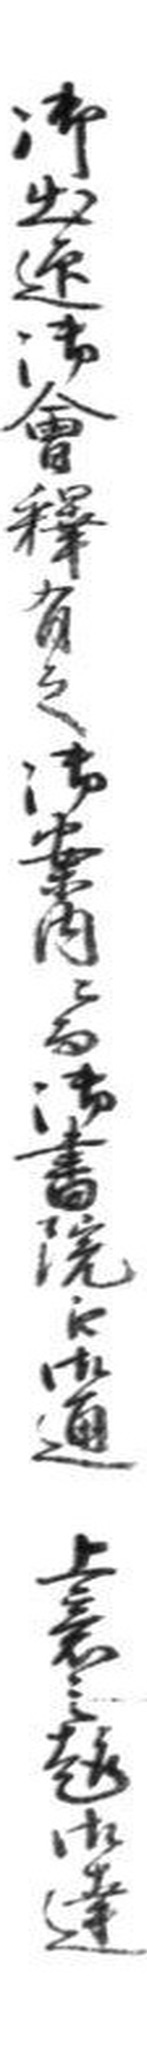御出迎御会釈有之御案内ニ而御書院江御通上意之趣御達
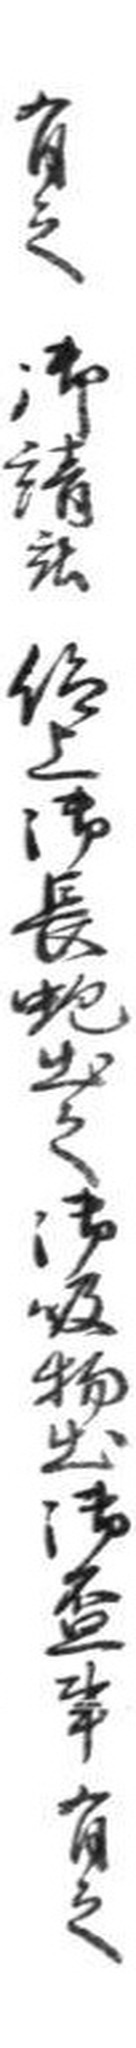有之御請被仰上御長蚫出之御吸物出御盃事有之
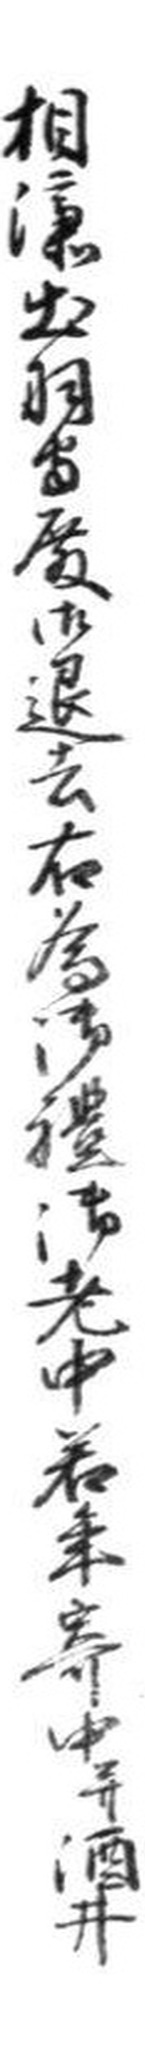相済出羽守殿御退出右為御礼御老中若年寄中并酒井
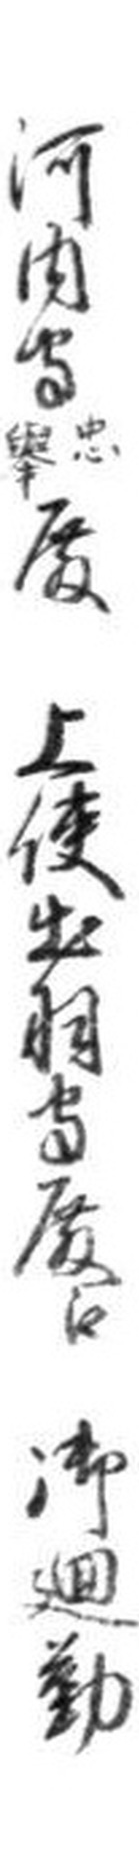河内守忠挙殿上使出羽守殿江御廻勤
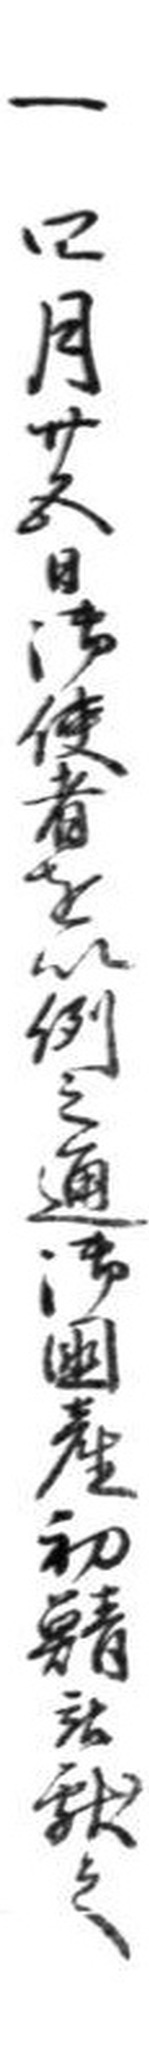一四月廿五日御使者を以例之通御国産初鯖被献之
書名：家譜 七 光通公 従寛文四年到同九年
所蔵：福井県文書館 Fukui Prefectural Archives
